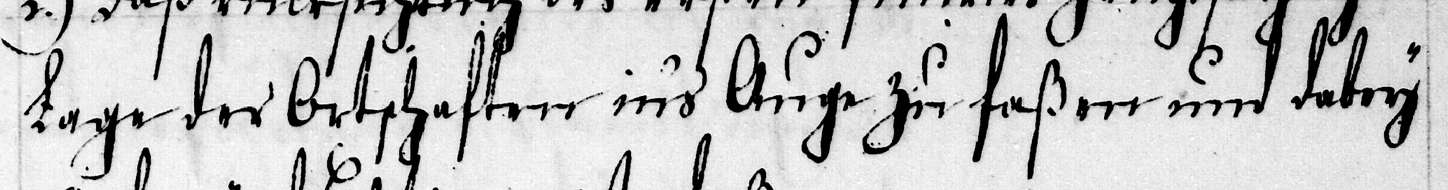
Lage der Ortschaften in’s Auge zu faßen und dabey
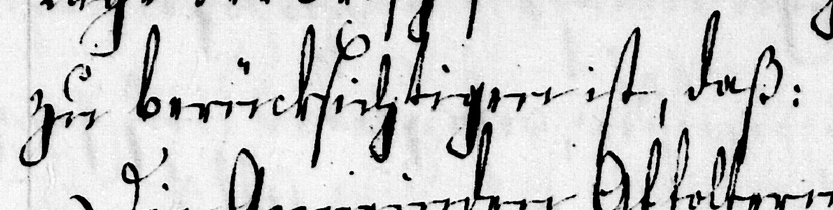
zu berücksichtigen ist, daß:
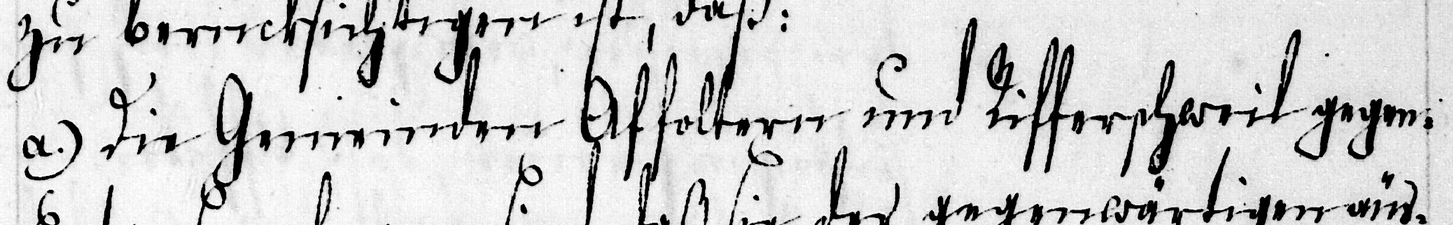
a.) Die Gemeinden Affoltern und Rifferschweil gegen¬
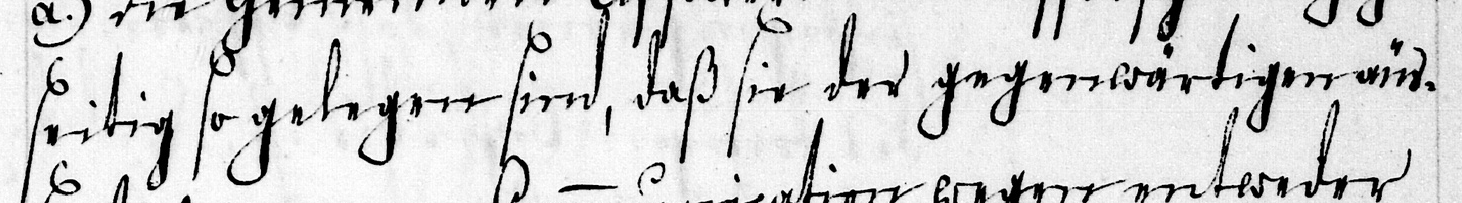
seitig so gelegen sind, daß sie der gegenwärtigen äuß¬
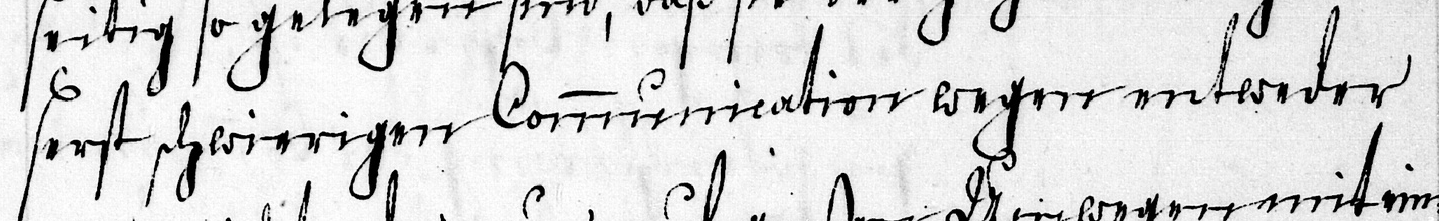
erst schwierigen Communication wegen entweder
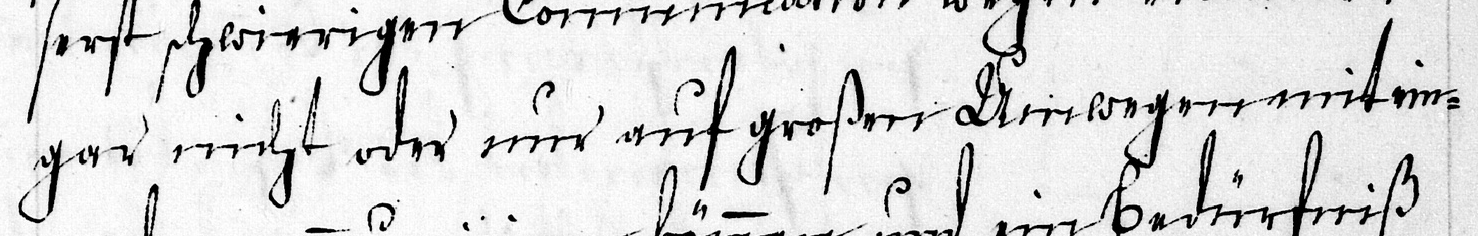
gar nicht oder nur auf großen Umwegen mitein¬
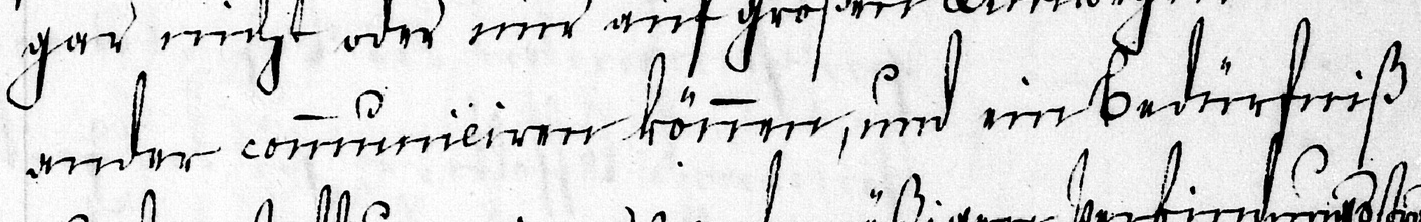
ander communiciren können, und ein Bedürfniß
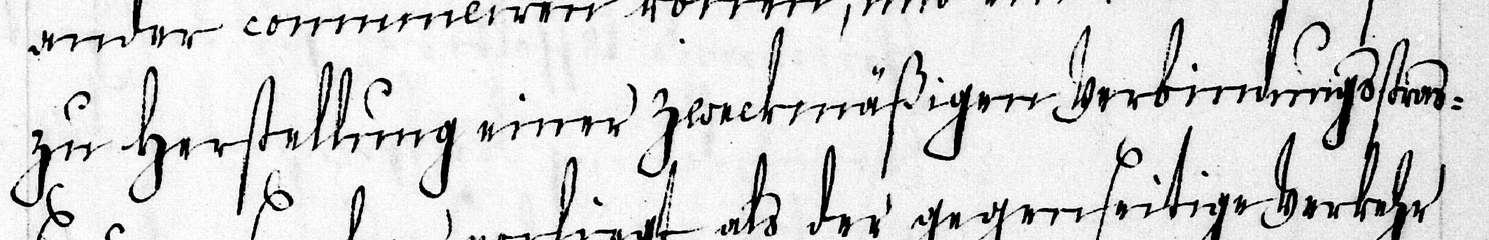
zu Herstellung einer zweckmäßigen Verbindungsstra¬
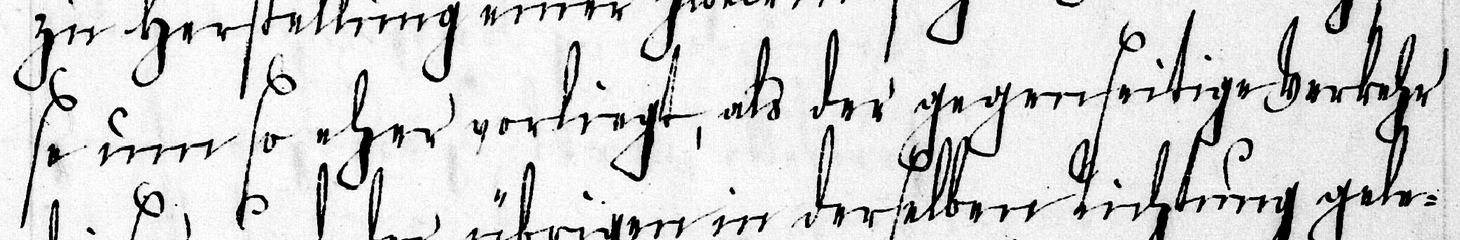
ße um so eher vorliegt, als der gegenseitige Verkehr
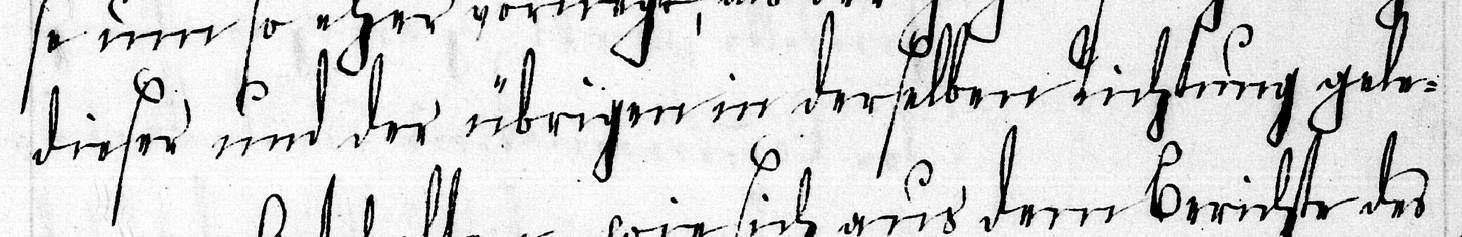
dieser und der übrigen in derselben Richtung gele¬
